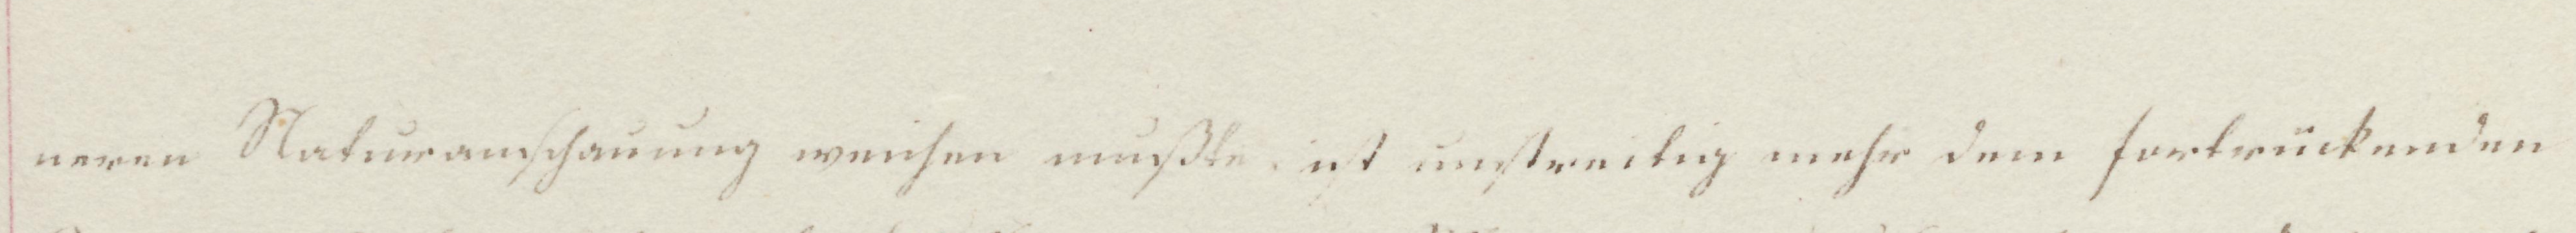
neren Naturanschauung weichen mußte, ist unstreitig mehr dem fortrückenden
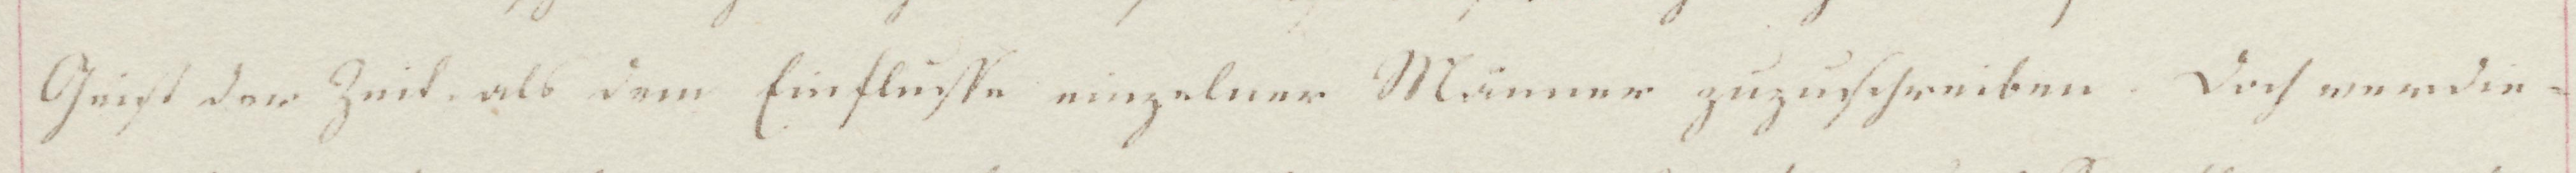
Geist der Zeit, als dem Einflusse einzelner Männer zuzuschreiben. Doch verdie-
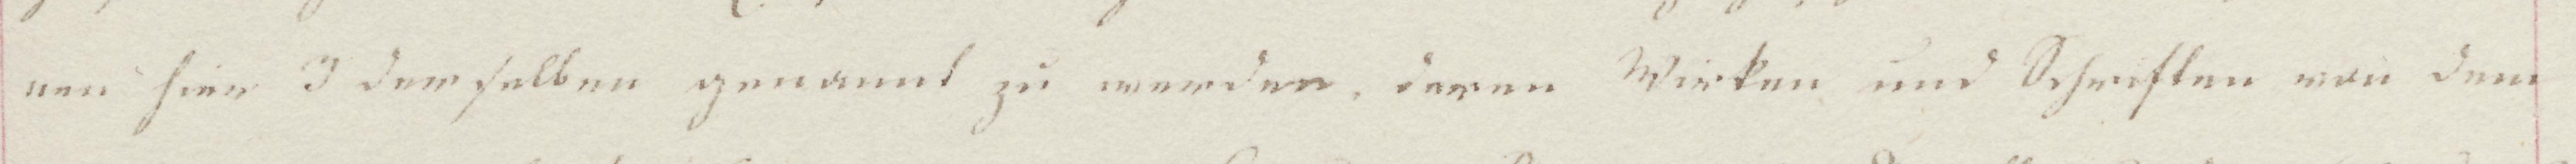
nen hier 3 derselben genannt zu werden, deren Wirken und Schriften von dem
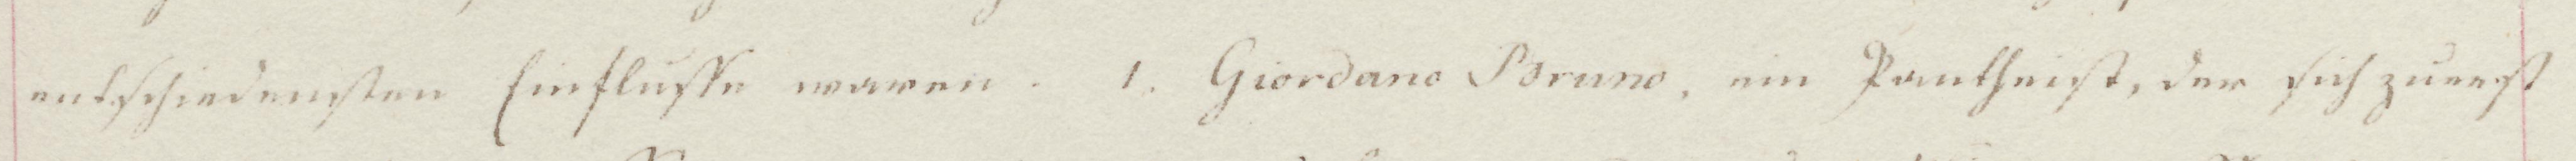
entschiedensten Einflusse waren. 1. Giordano Bruno, ein Pantheist, der sich zuerst
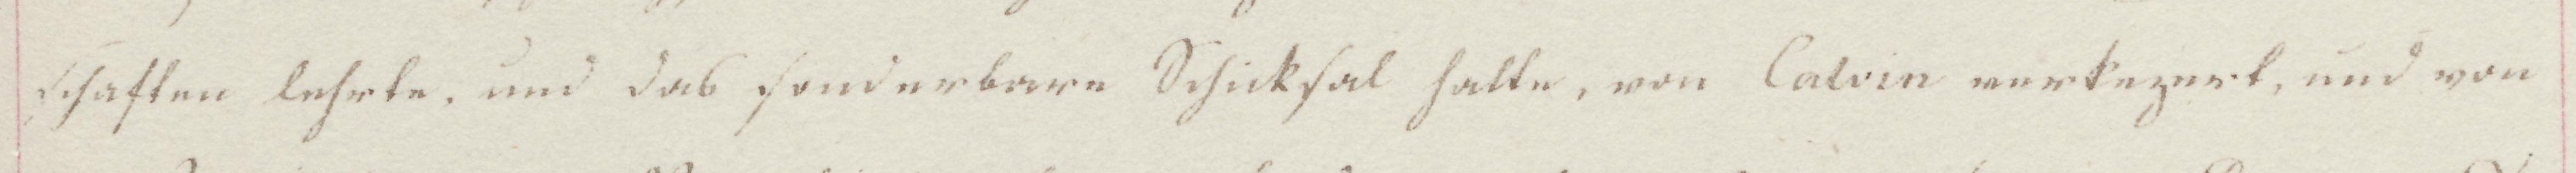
schaften lehrte, und das sonderbare Schicksal hatte, von Calvin verketzert, und von
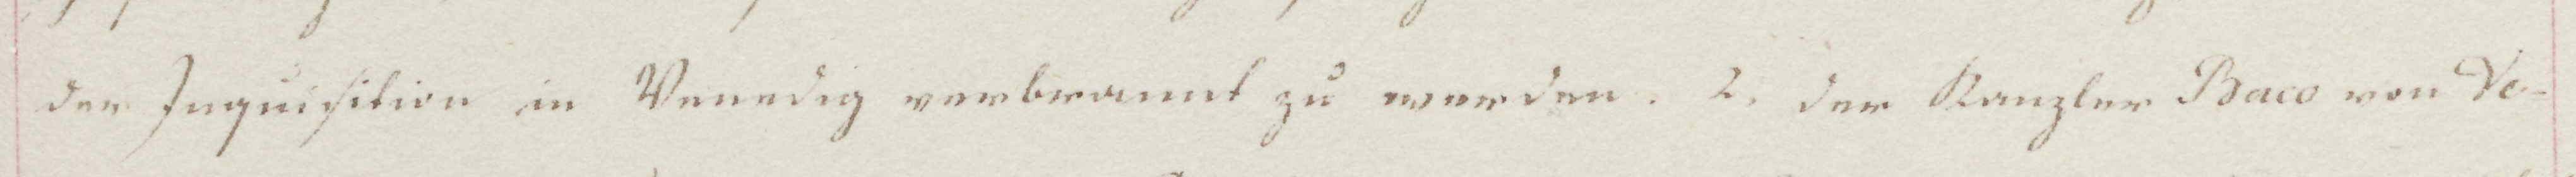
der Inquisition in Venedig verbrannt zu werden. 2. der Kanzler Baco von Ve-
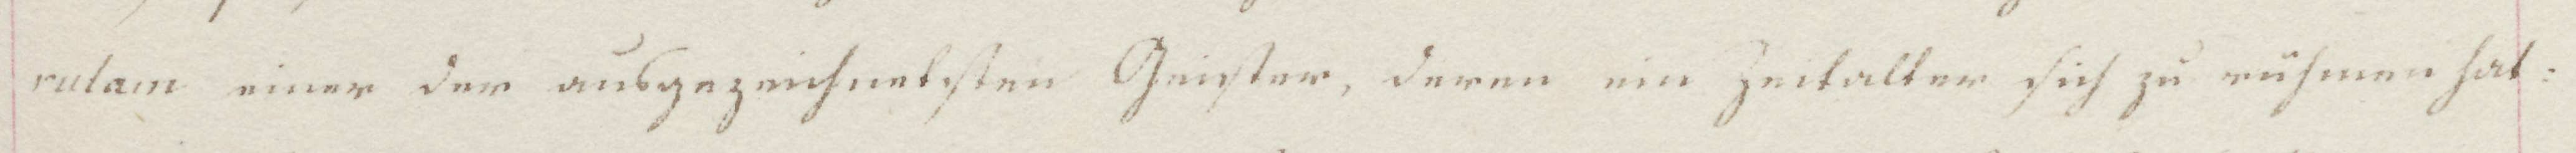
rulam einer der ausgezeichnetsten Geister, deren ein Zeitalter sich zu rühmen hat:
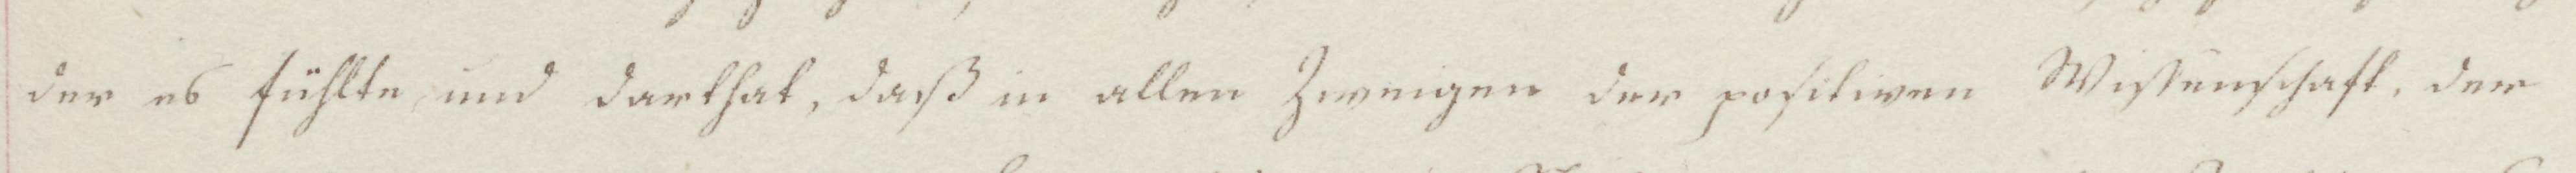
der es fühlte und darthat, daß in allen Zweigen der positiven Wissenschaft, der
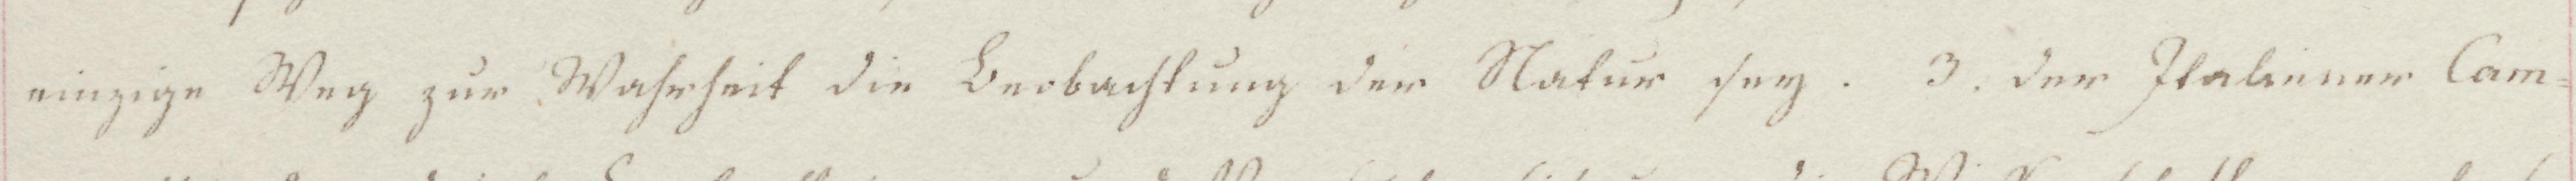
einzige Weg zur Wahrheit die Beobachtung der Natur sey. 3. der Italiener Cam-
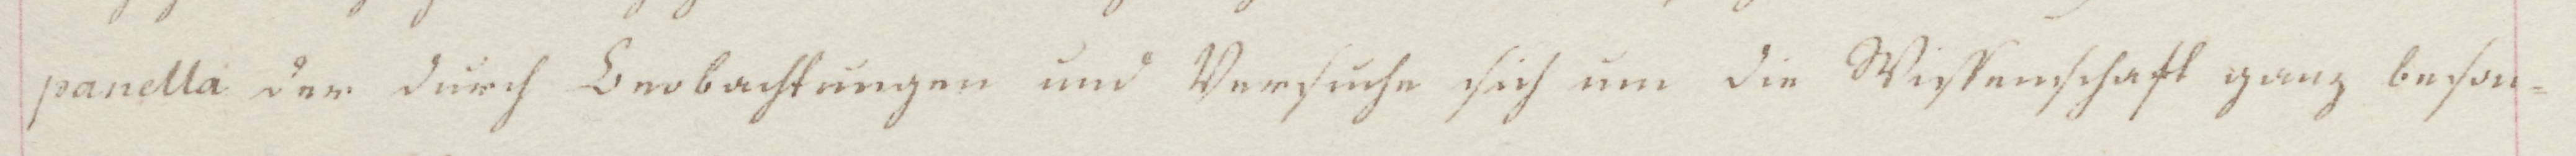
panella der durch Beobachtungen und Versuche sich um die Wissenschaft ganz beson-
